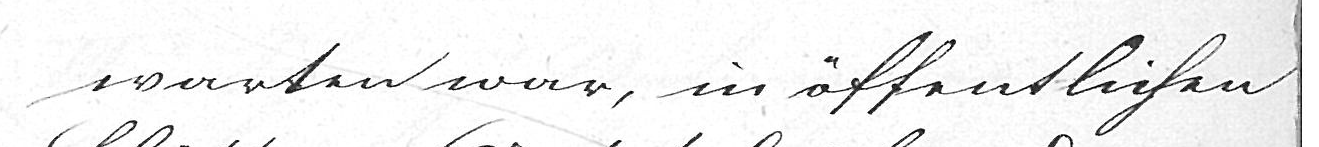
warten war, in öffentlichen
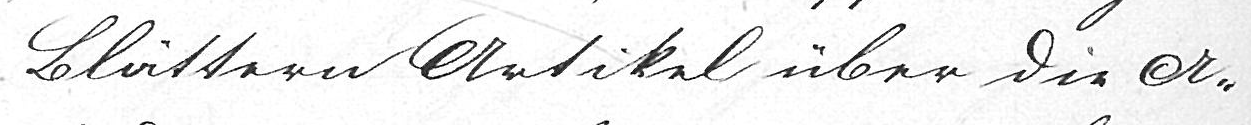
Blättern Artikel über die A-
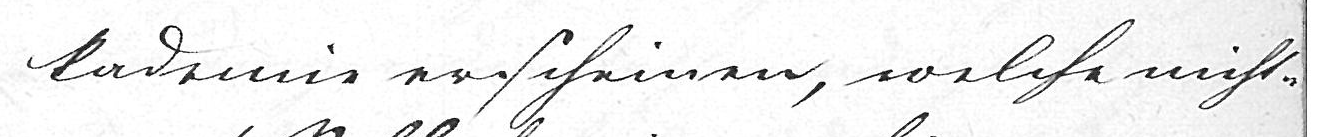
kademie erscheinen, welche nicht-
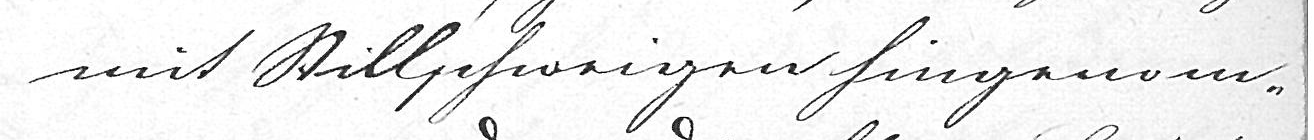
mit Stillschweigen hingenom-
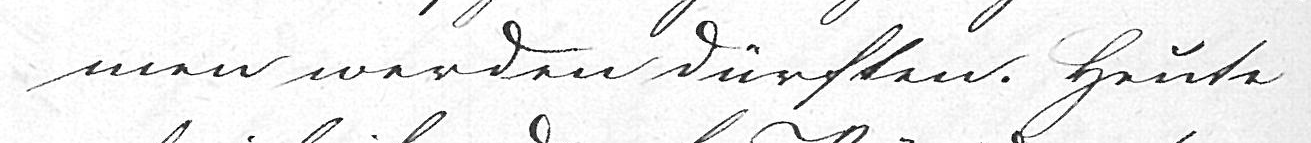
men werden dürften. Heute
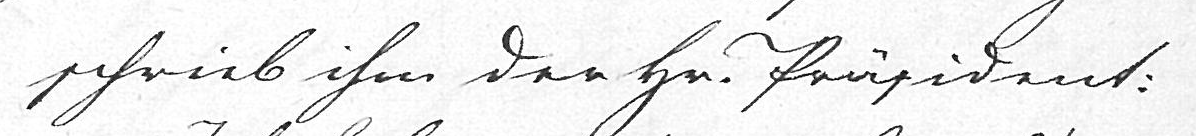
schrieb ihm der Hr. Präsident:
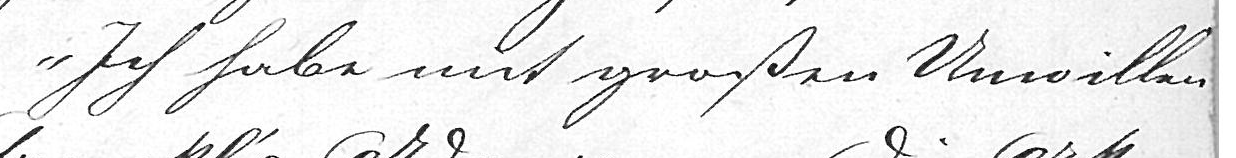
" Ich habe mit großem Unwillen
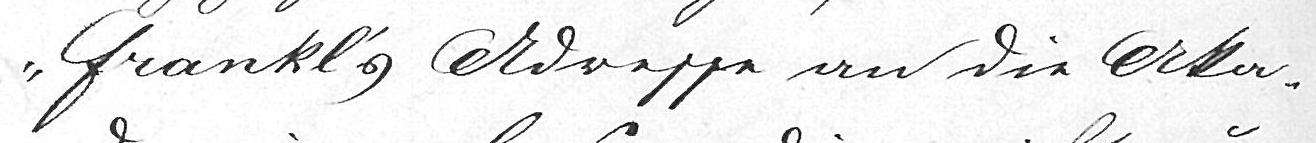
" Frankl's Adresse an die Aka-
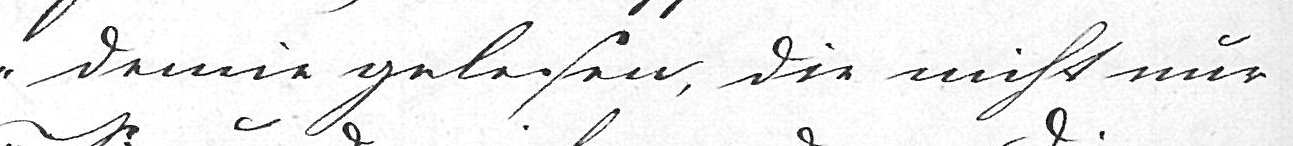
" demie gelesen, die nicht nur
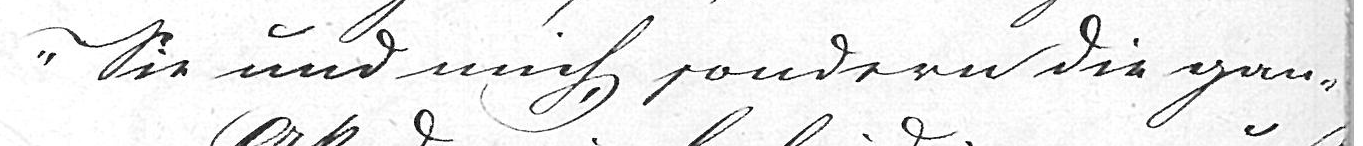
" Sie und mich, sondern die gan-
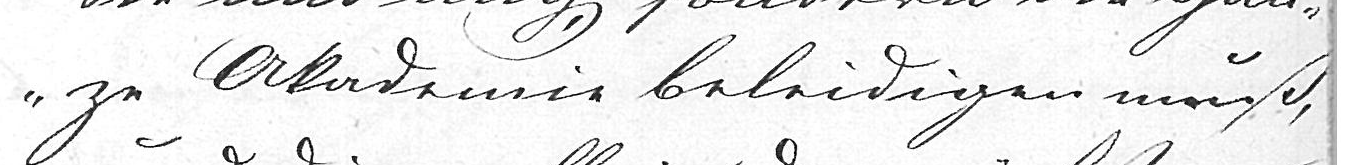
" ze Akademie beleidigen muß,
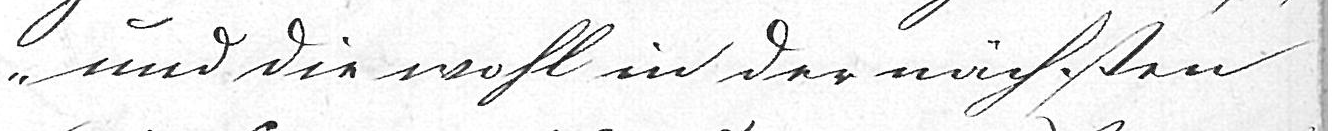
" und die wohl in der nächsten
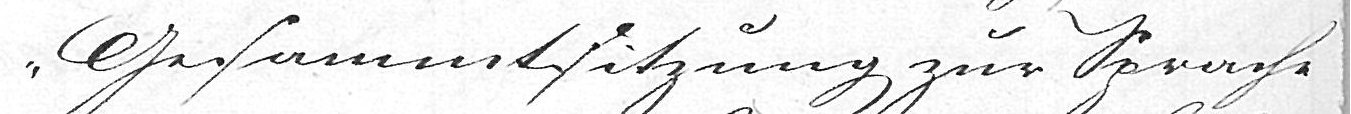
" Gesammtsitzung zur Sprache
